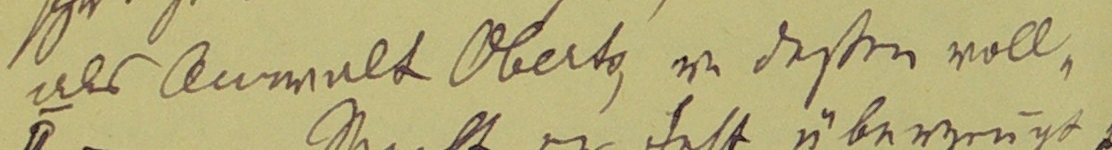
als Anwalt Obert‘s, von dessen voll¬
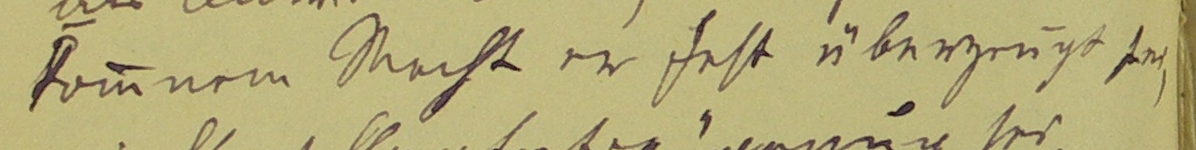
kommenen Recht er fest überzeugt sei,
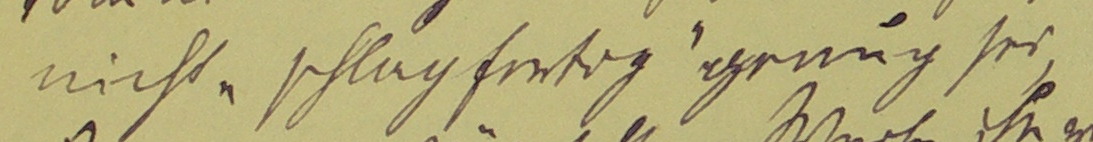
nicht „ schlagferig“ genug sei,
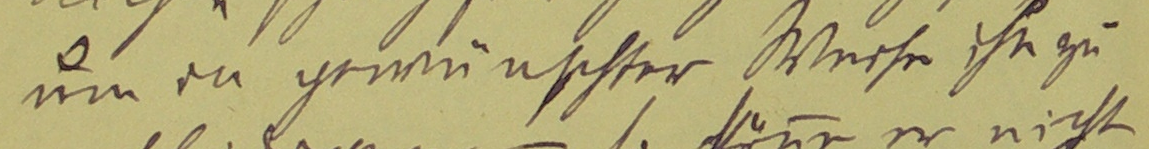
um in gewünschter Weise ihn zu
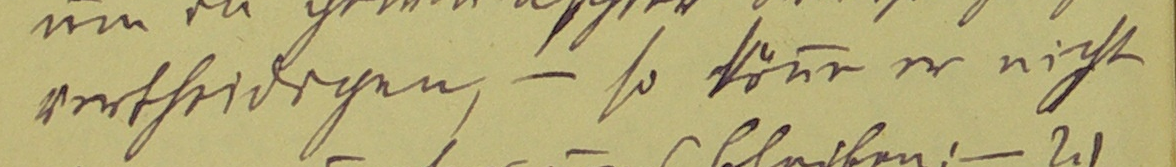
rechtfertiegn- so könne er nicht
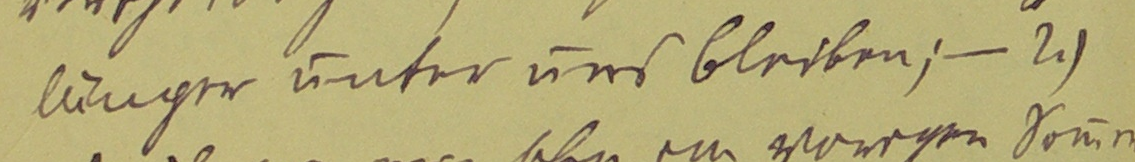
länger unter uns bleiben; 2)
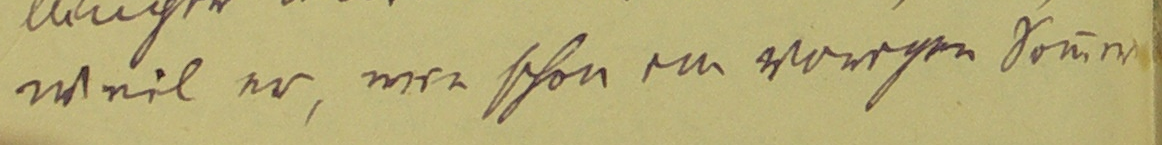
weil er, wie schon im vorigen Sommer
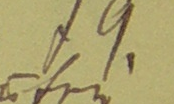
79
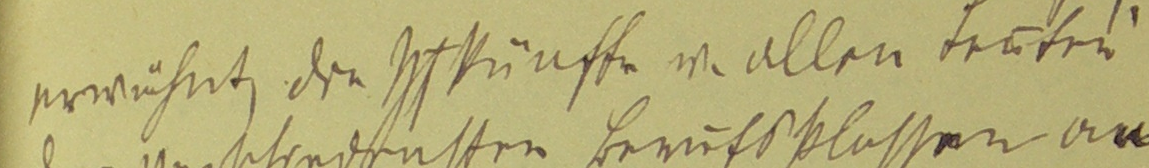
erwähnt, die Zusammenkünfte vor allen Leuten
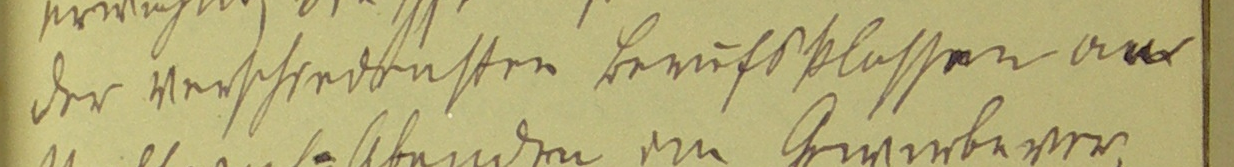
der verschiedensten Berufsklassen am
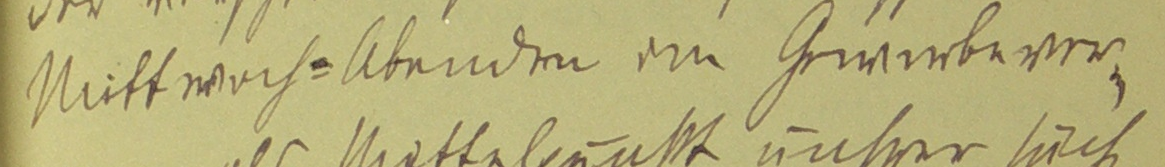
Mittwoch –Abenden im Gewerbever¬
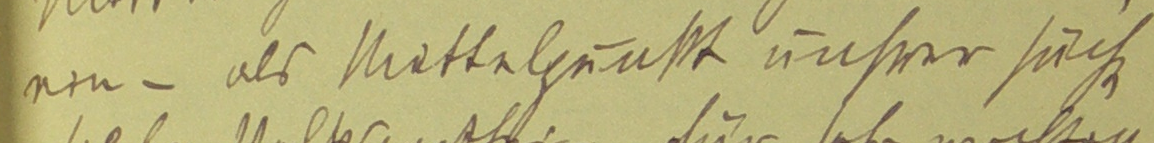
ein -als Mittelpunkt unserer säch¬
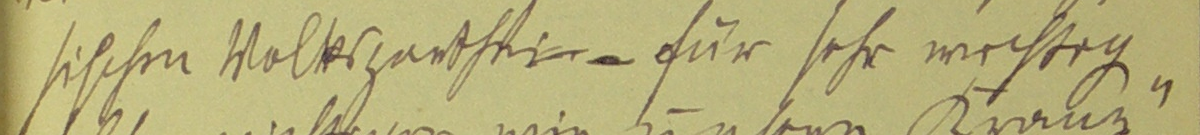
sischen Volkspartheien-für sehr wichtig
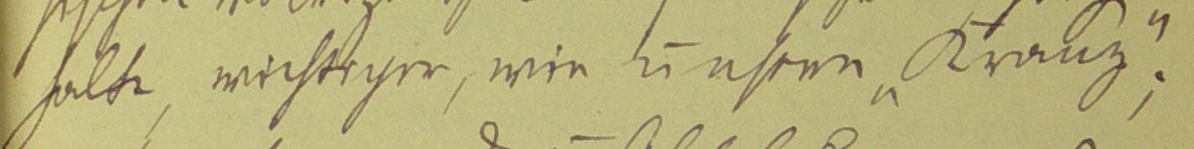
halte, wichtiger wie unsrer „Kranz“
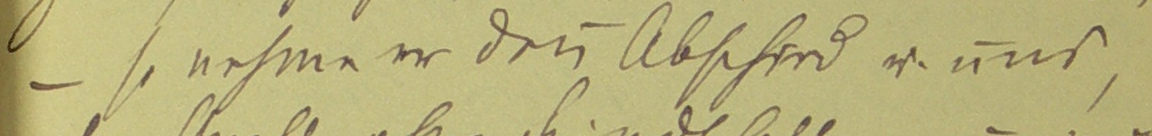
- so nehme er Abschied von uns
